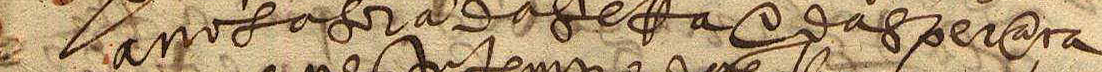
a nosa sorā da seRa e da sperāça
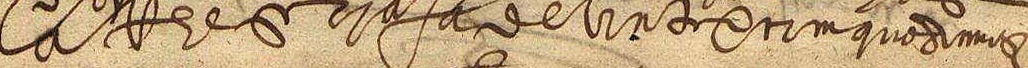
a Rhe serja Ja de vinte e cimquo Annos
